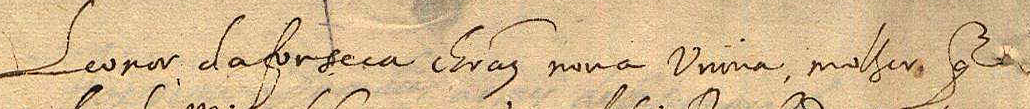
Leonor da fonseca chrām noua Viuua, molher q̄
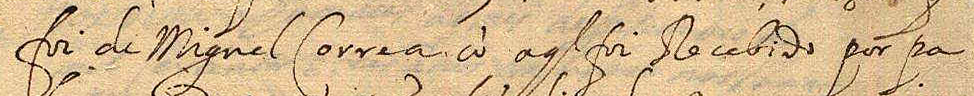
foi de Miguel Correa cō a ql foi Recebido por pa
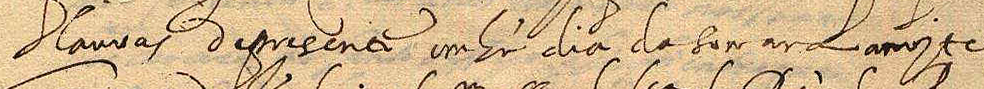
lauras de presente em hū dia da somana a nojte
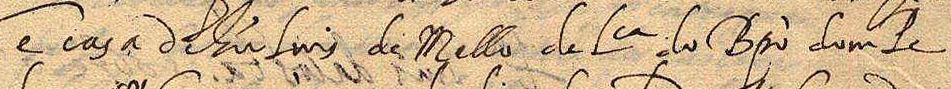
ē casa de hū Luis de Mello de Lça do Bpō dom Pe
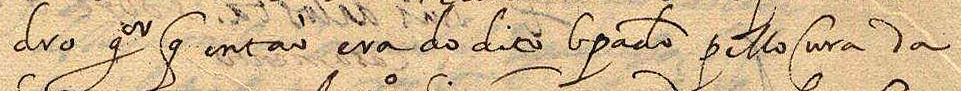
dro gor q̄ entaõ era do dito bpādo pello Cura da
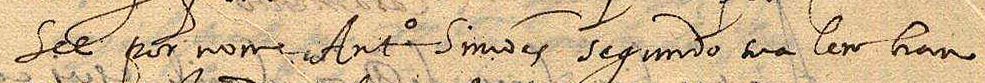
See por nome Anto Simões segundo sua lembran
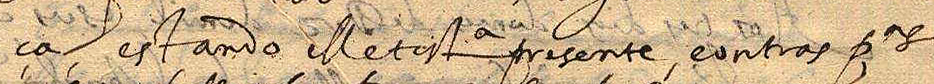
ça estando elle testa presente, e outras pas
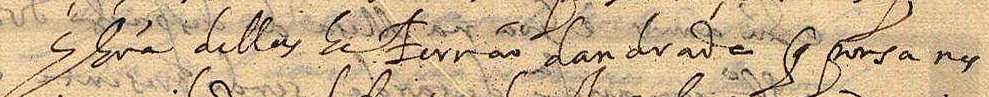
E huā dellas he Ferrão dandrade q̄ pousa nes
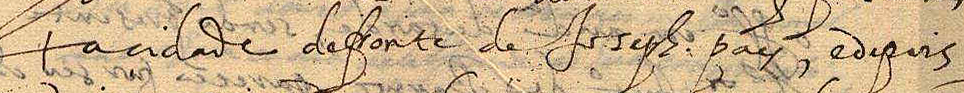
ta cidade defronte de Joseph paes, e depois
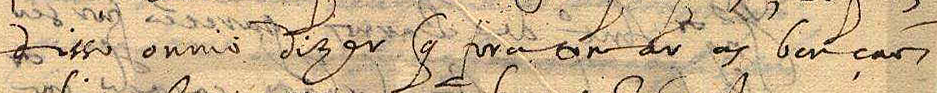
disso ouuio dizer q̄ fora tomar as bençaõs
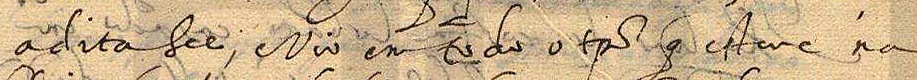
a dita see, e vio em todo o tpō q̅ esteue na
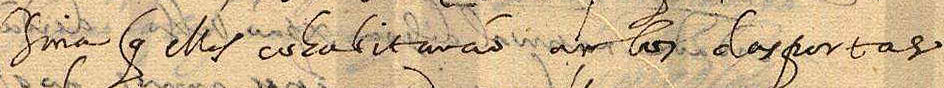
China q̄ elles cohabitavaõ ambos das portas
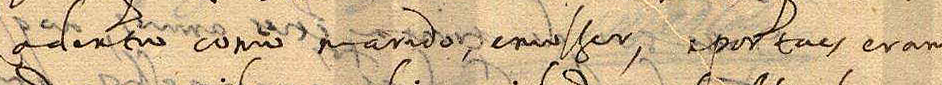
adentro como marido, e molher, e por taes eram
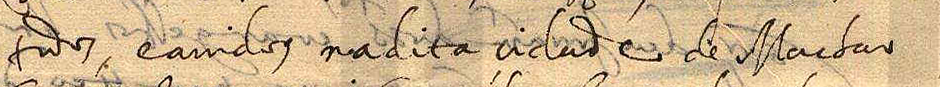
tidos, e auidos na dita cidade de Machao
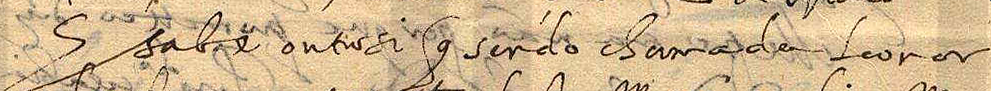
E sabe outrosi q̄ sendo chamada Leonor
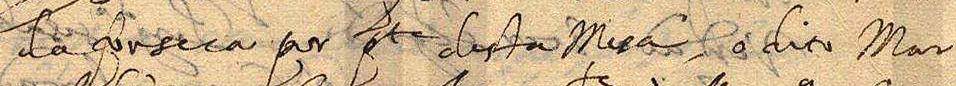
da fonseca por pte desta Mesa, o dito Mar
